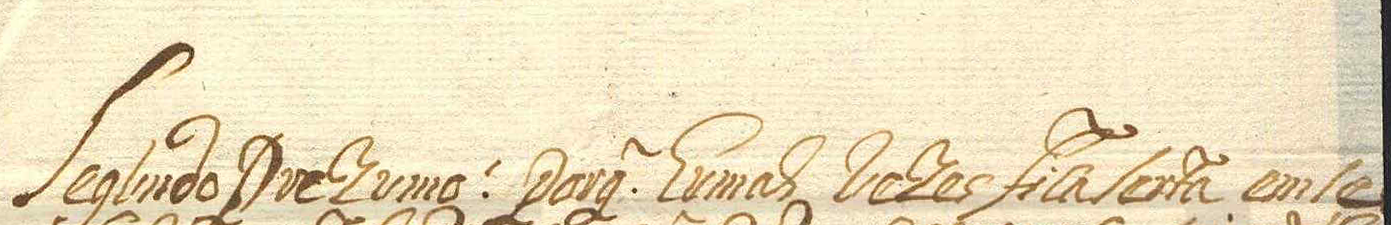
Segundo PreZumo: Porq̄. humas Vezes fica serta em se
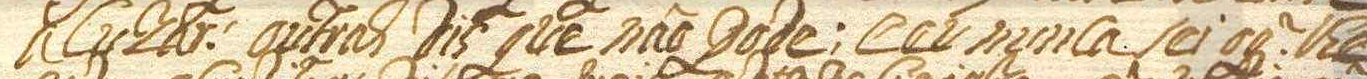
aCuzar: outras dis que naõ pode; e eu nunca sei o q̄. lhe
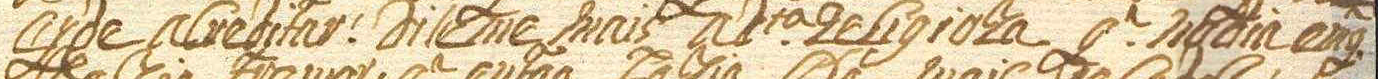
eyde aCreditar: diseme mais a d.ta religioza q̄ no dia em q̄
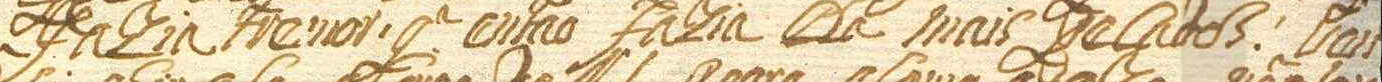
FaZia tremor, q̄ então faZia ela mais peCados: Ven
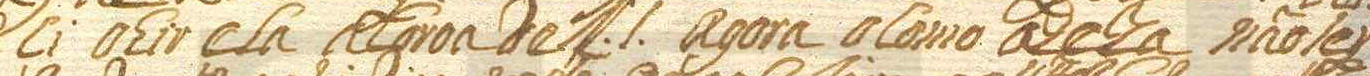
ci o hir ela a Coroa de N. S. agora o Como a Reza naõ ser
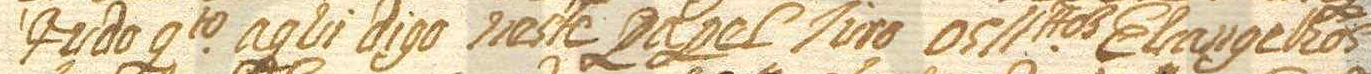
tudo q.to aqui digo neste papel Iuro os ss.ttos Evangelhos
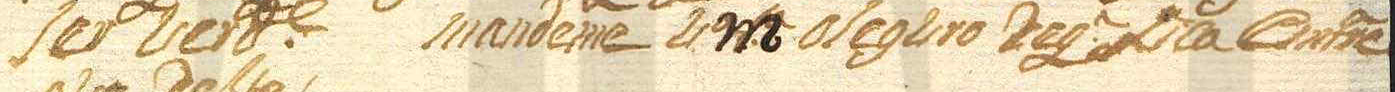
ser verd.e mandeme vm. o seguro de q̄ fica Emtre
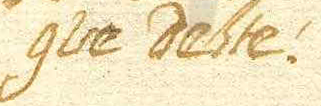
gue deste.
